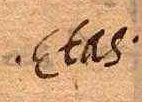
.Etas.
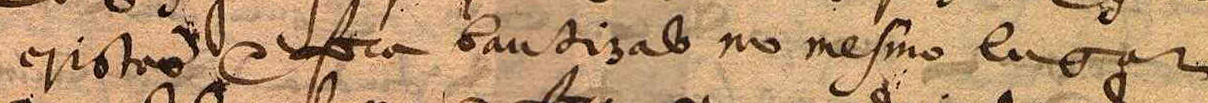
cristaõ e fora bautizado no mesmo lugar
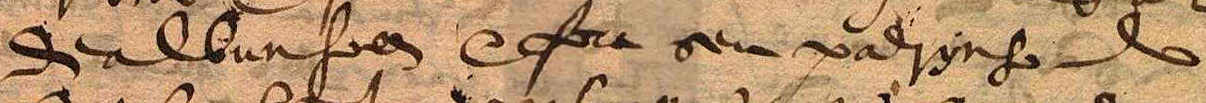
de albunholl e fora seu padrynho do
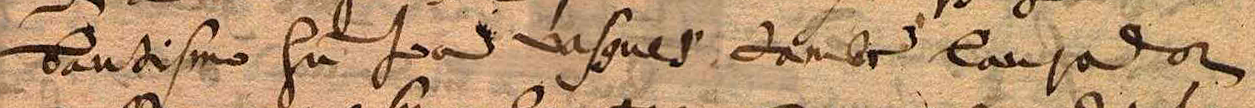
bautismo hū Joa̅ vasques tambē laurador
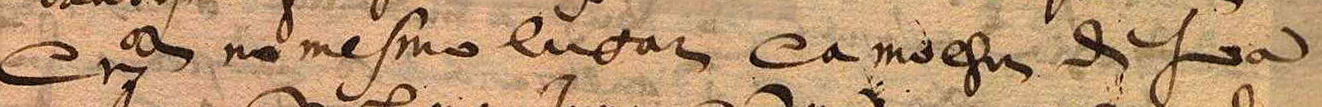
e mor no mesmo lugar e a molher de Joa̅
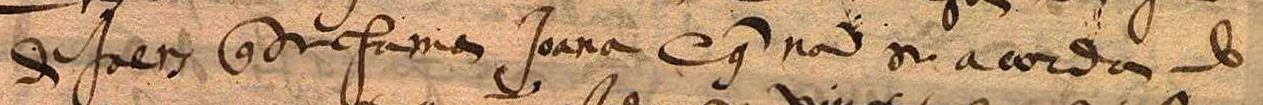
de Jaem q̅ se chama Joana e q̅ na̅ se acorda do
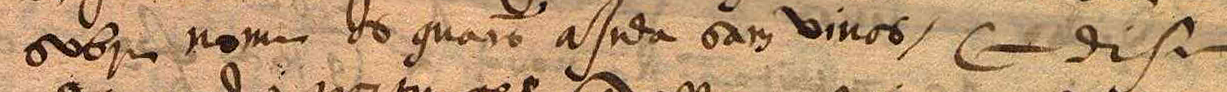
sobrenome os quaēs aJnda sam viuos / E dise
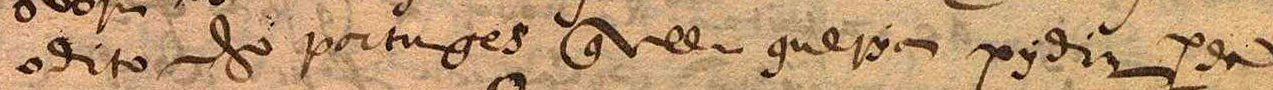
o dito djo portuges q̅ elle querya pydir ꝑdā
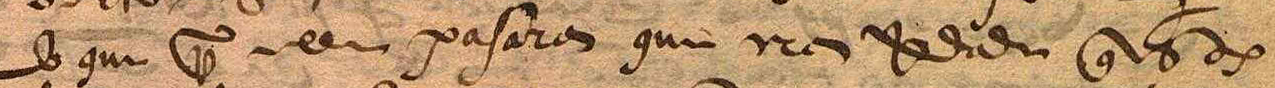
do que p̄o elle pasara que era ꝟdade q̅ estꝭ
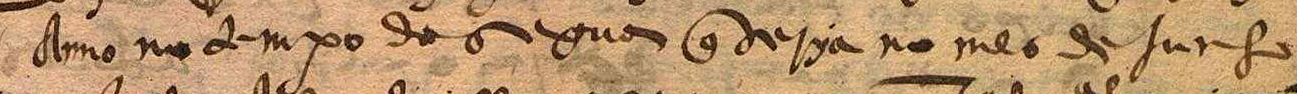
Anno no tempo da sequa q̄ serya no mes de Junho
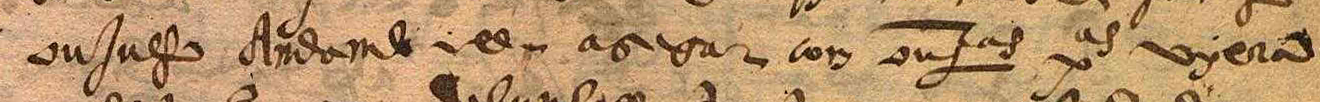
ou Julho Andando elle a seqar com outras pas vyerā
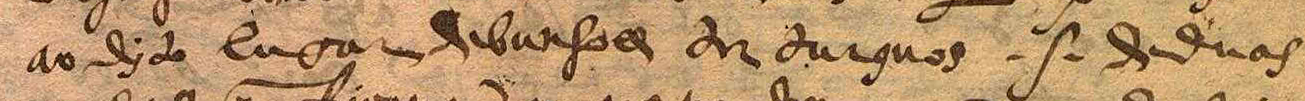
ao djto lugar de bunholl ter turquos .s. de duas
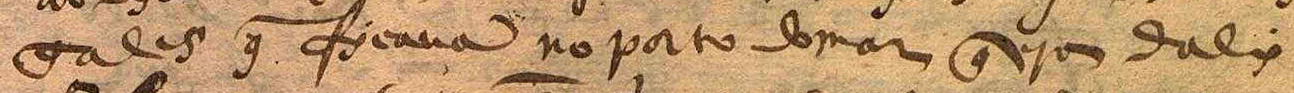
gales q̄ fjcauā no porto do mar q̅ era daly
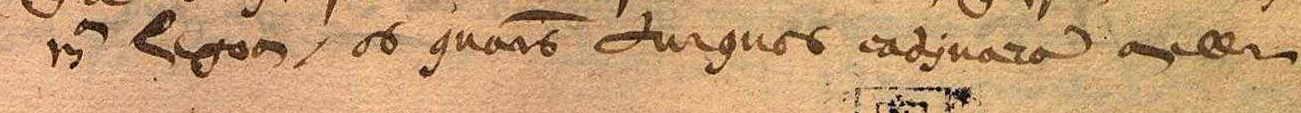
ma legoa / os quaēs turquos catjuarā a elle
